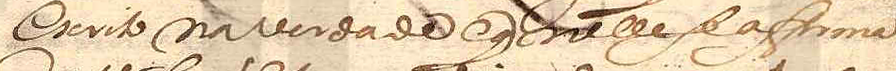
escrito na verdade e q̄ nelle se affirma
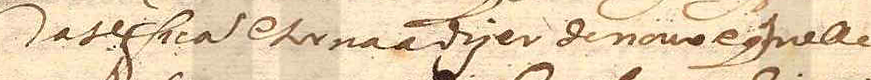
Ratefica e torna a dizer de nouo e q̄ nelle
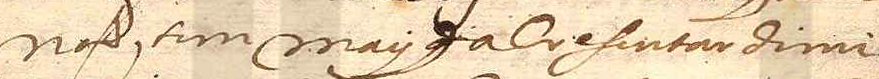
naõ tem mais q̄ aCresentar dimi
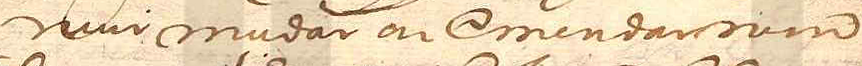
nuir mudar ou emendar nem
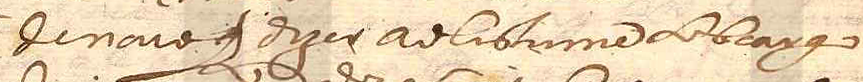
de nouo q̄ dizer ao Custume sob cargo
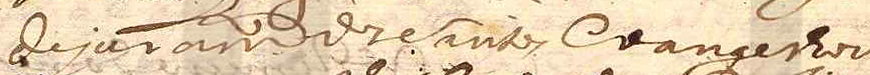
de juramto dos Santos Evangelhos
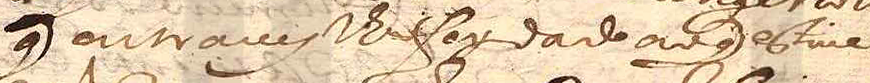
q̄ outra ues lhe foy dado ao q̄ estiue
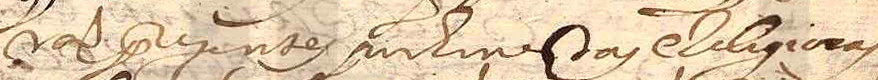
raõ prezentes por honestas e Religiozas
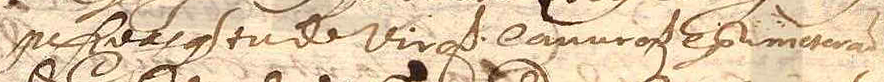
pessoas q̄ tudo viraõ e ouuraõ e prometeraõ
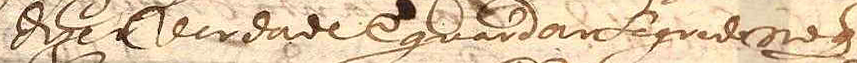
dizer verdade e guardar segredo no q̄
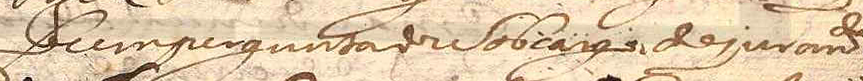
foce perguntado Sob cargo do juramto
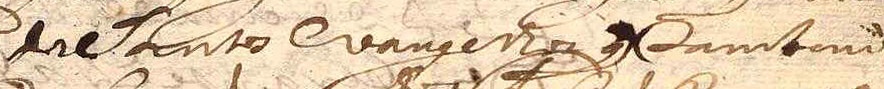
dos Santos Evangelhos q̄ tambem
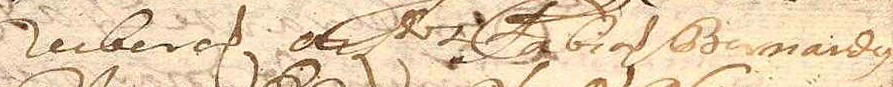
Receberaõ os Ldos Fabiaõ Bernardes
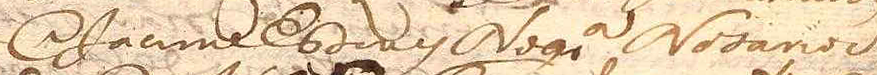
e Jacome Esteues Nogra Notarios
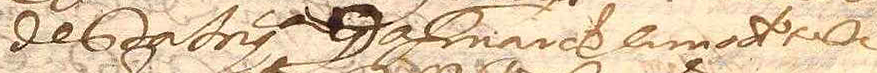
desta Inqçao q̄ asinaraõ com o d̄o teste
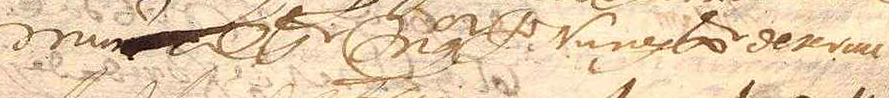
mun_ o sor Inqor Jo Nunes xer o escreui
